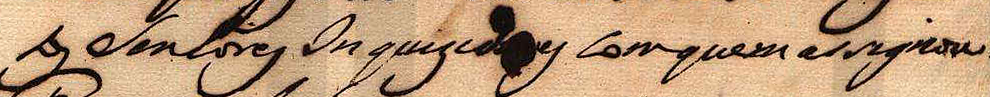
tos Senhores Inquizid_es com quem assignou
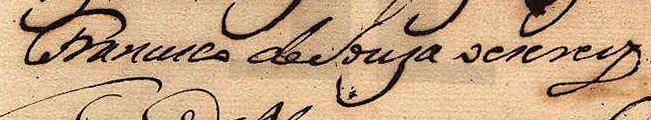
Francisco de Souza o escrevj
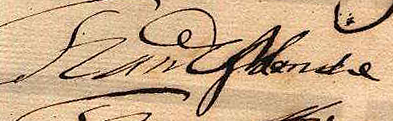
Franco Mendo
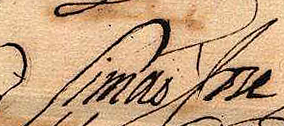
Simaõ Joze
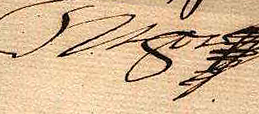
Trigozo
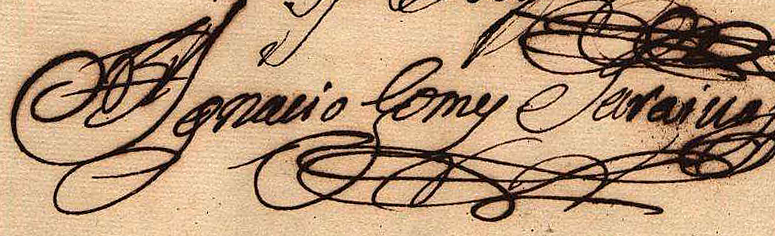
Jgnacio Gomes Saraiua
